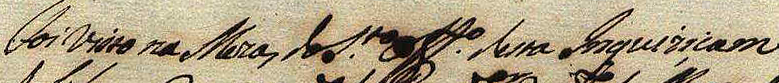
Foi visto na Meza do S.to off.o desta Inquiziçam
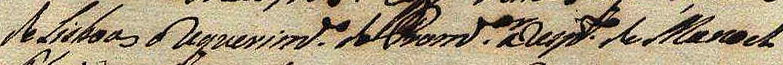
de Lisboa o Requerim.to do Prom.o a Resp.to de Manoel
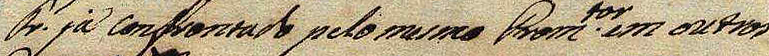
Fr̄. já confrontado pelo mesmo Prom.tor em outros
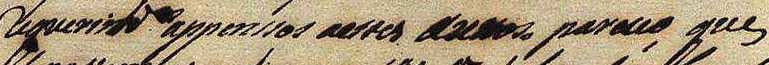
Requerimt.os appenssos a estes auttos pareceo, que
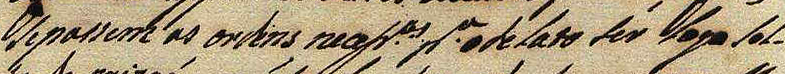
se passem as ordens necess.as p.a o delato ser logo sol
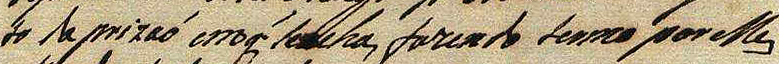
to da prizaõ em q̄ se acha, fazendo termo por elle
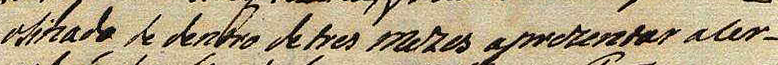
asinado, de dentro de tres mezes aprezentar a cer
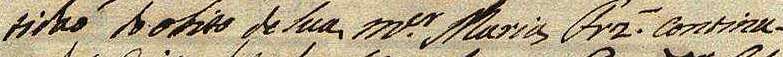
tidaõ do obito de sua m.er Maria Frz̄ continu
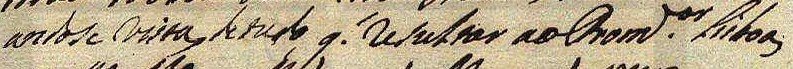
andose vista de tudo q̄ Resultar ao Prom.or Lisboa
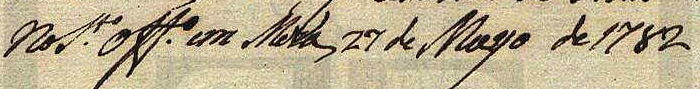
No S.to off.o em Meza, 27 de Mayo de 1782
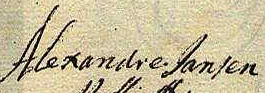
Alexandre Iansen
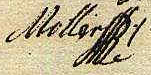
Moller
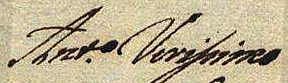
Ant.o Verissimo
